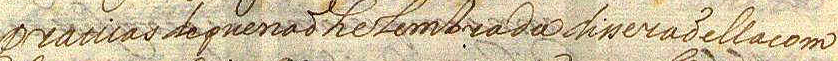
praticas de que naõ he lembrada disseraõ ella com
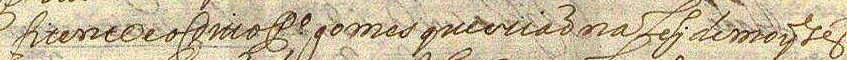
fitente e o ditto P.o gomes que criaõ na Lej de moyses
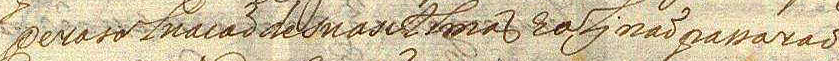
pera saluaçaõ de suas Almas E alj naõ passaraõ
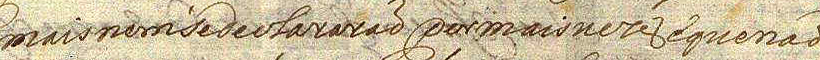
mais nem se declararaõ per mais uezes e que naõ
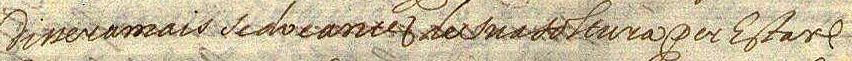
dissera mais sedo e antes de sua soltura per Estar
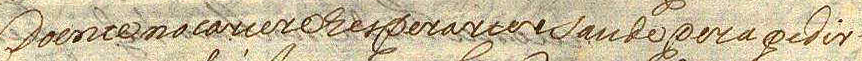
Doente no carçere E esperar ter saude pera pedir
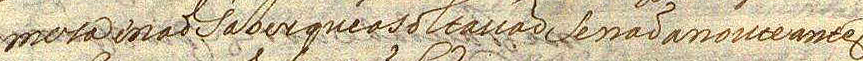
meza e naõ saber que a soltauaõ senão a nuote antes
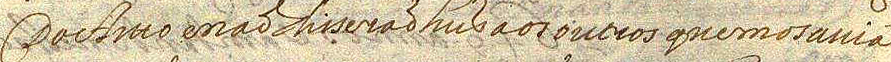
Do Auto e naõ disseraõ hus̄ aos outros quem os auia
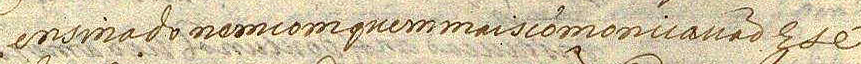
ensinado nem com quem mais comonicauaõ E se
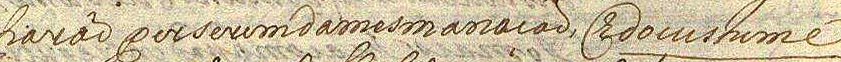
fiaraõ per serem da mesma naçaõ, E do custume
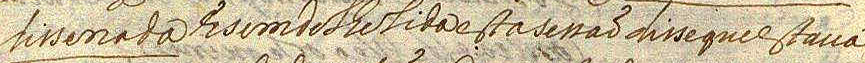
disse nada E semdolhe lida esta sessaõ disse que estaua
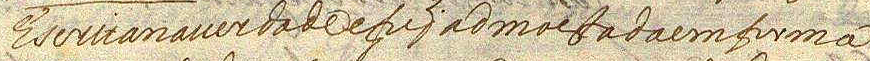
Escrita na uerdade e fuj admoestada em forma
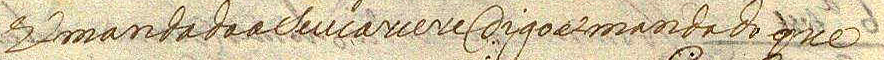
E mandada a seu carcere digo & mandado que
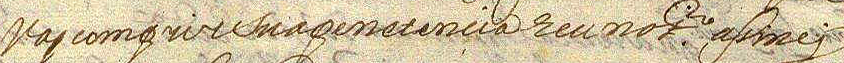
vaj comprir sua penetençia E eu not.ro assinej
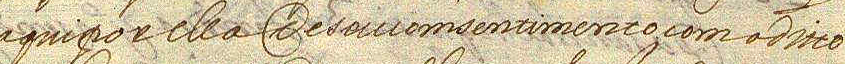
aqui por ella de seu comsentimento com o ditto
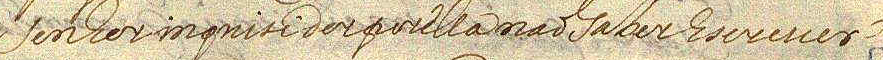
senhor inquisidor por ella naõ saber Escreuer
